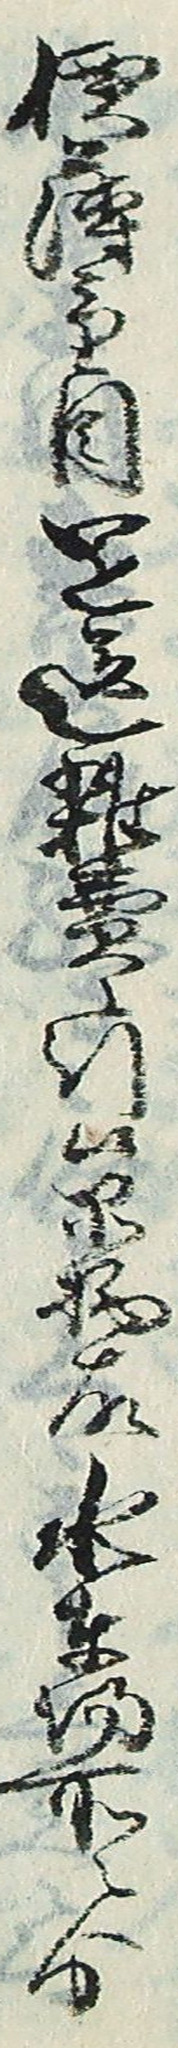価薄重目運送雑費に引候品柄故水車場所にゟ
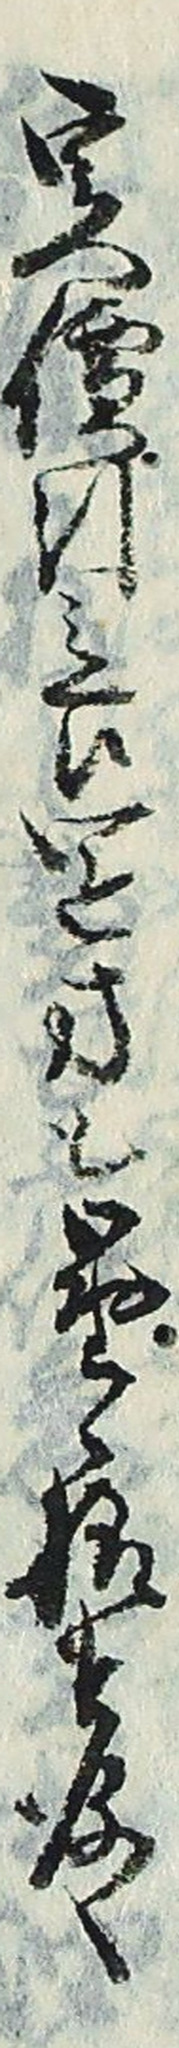実価引立候運方も御坐候様奉存候
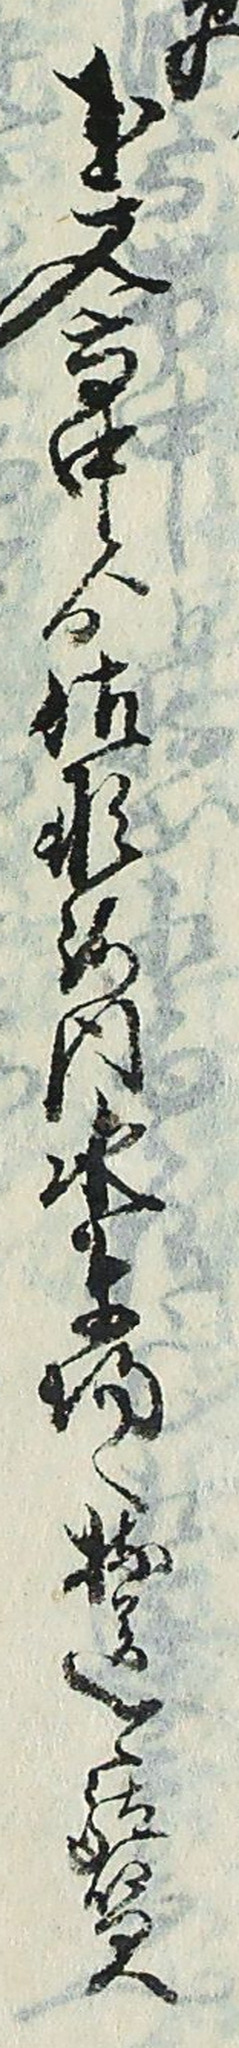本又市中ゟ佐那河内水車場へ持送候駄賃
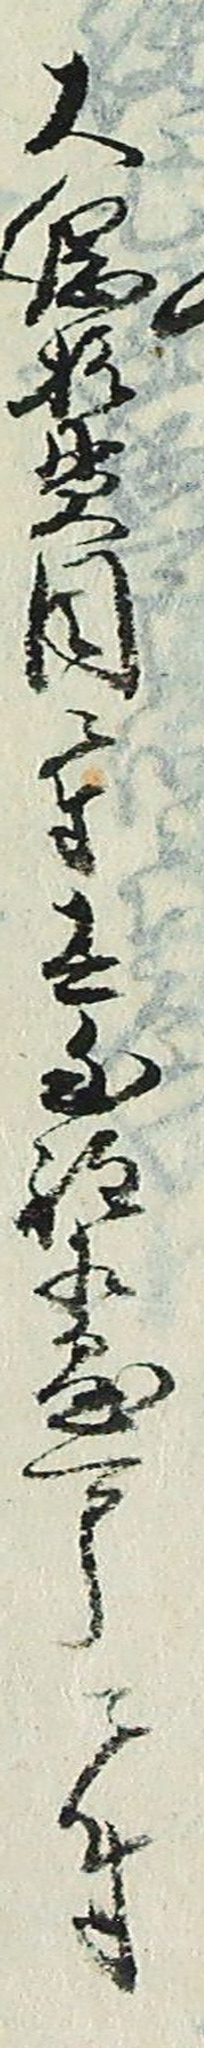大綱拾貫目に付壱匁程相懸可申に付
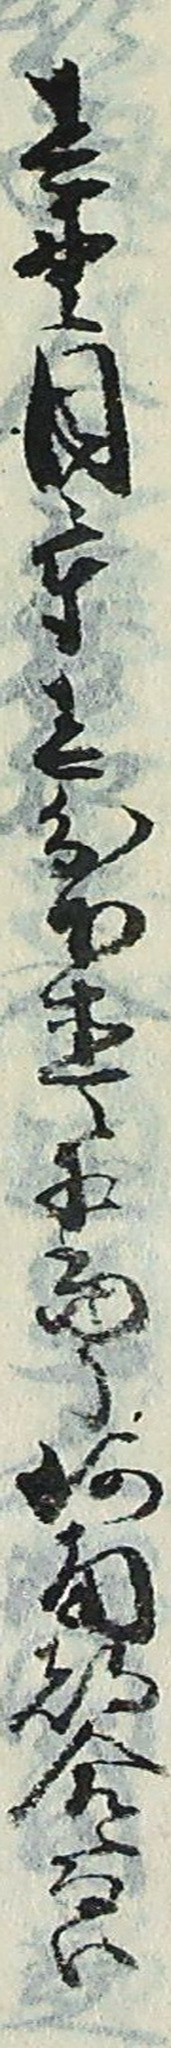壱貫目に付壱分下直に相当り何角都合候而は
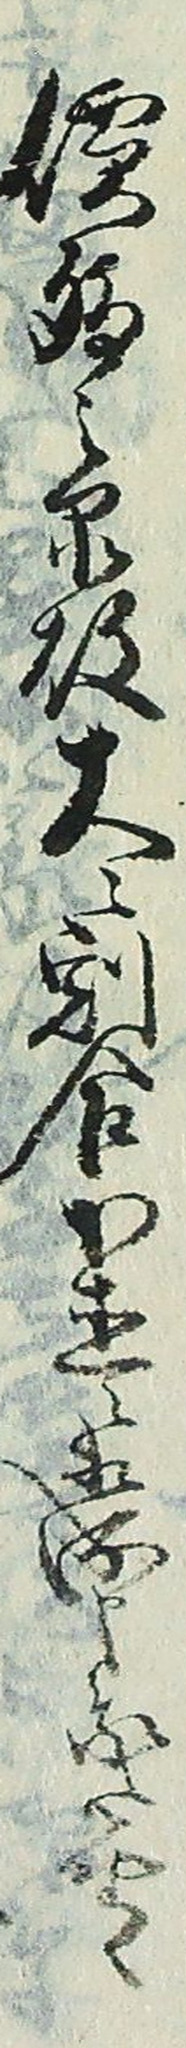価聊之品故大に割合下直に相成申義に御坐候
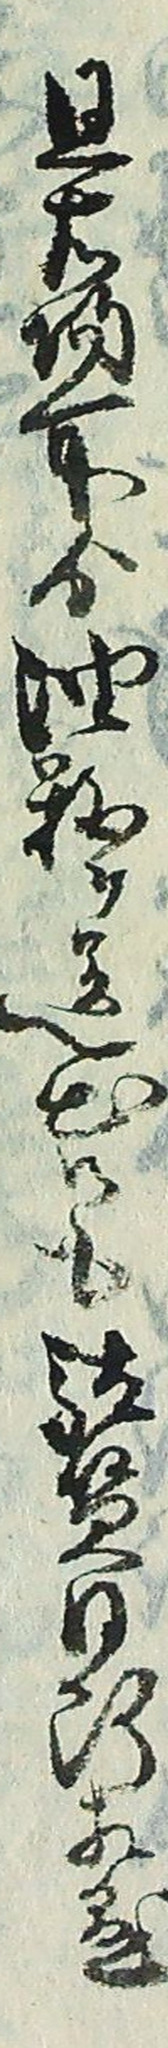且右場所ゟ油粕を送出候も駄賃同断相懸
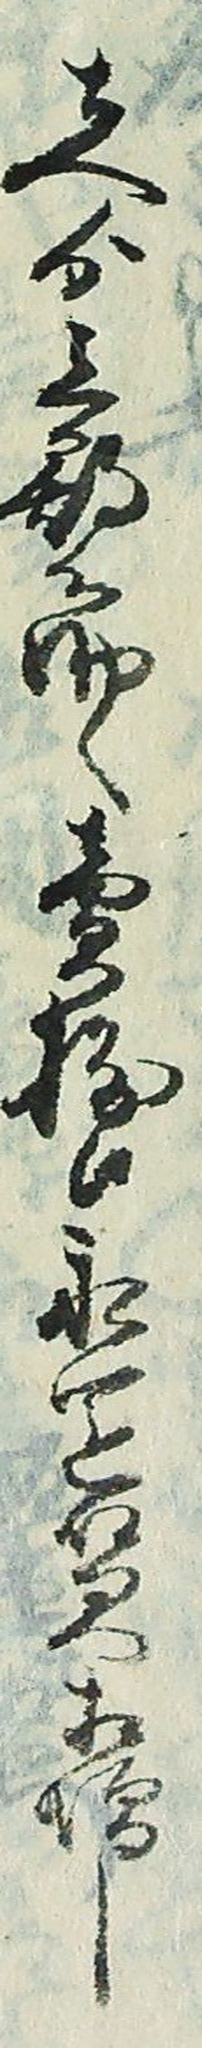夫ゟ三郡筋へ売捌候船運賃相増し
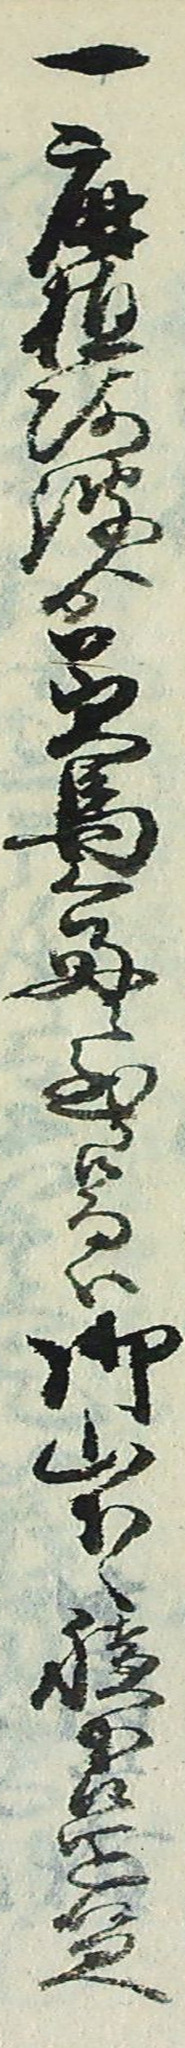一麻植阿波ゟ美馬之舟に至り候而は御山下へ積下候運賃
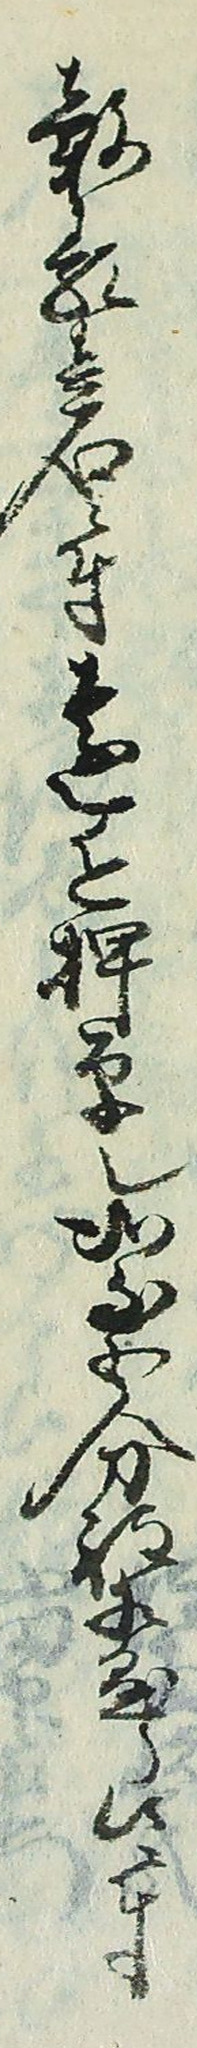穀類壱石に付遠近押平し弐匁五分程相懸り候に付
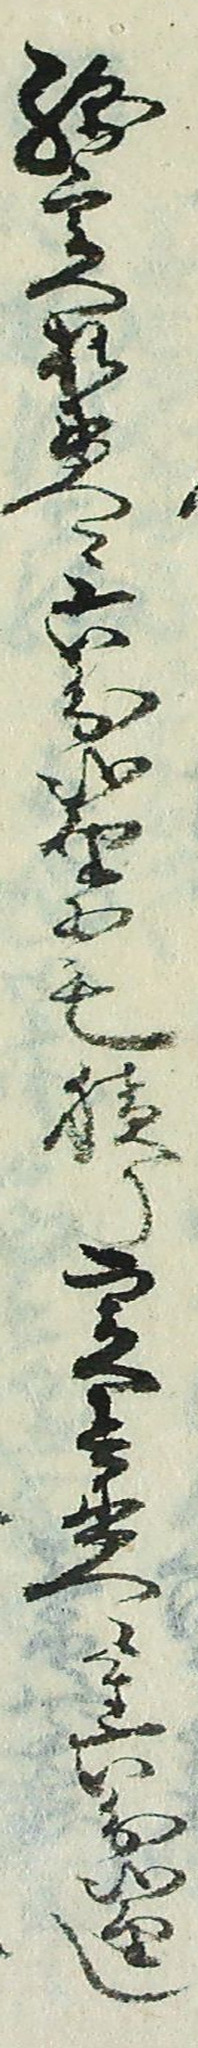綿実拾貫に六分弐厘五毛積り実壱貫に付六分弐厘之
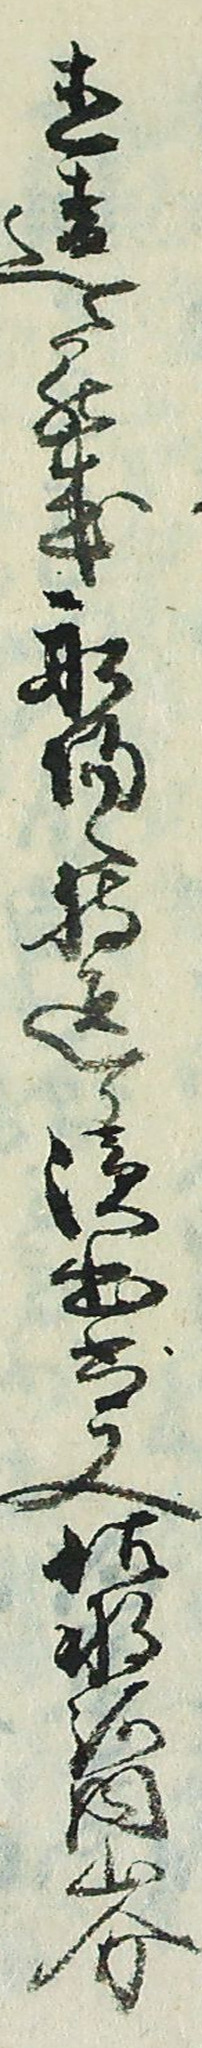直違に罷成船場へ持送り浜出尚又佐那河内山分
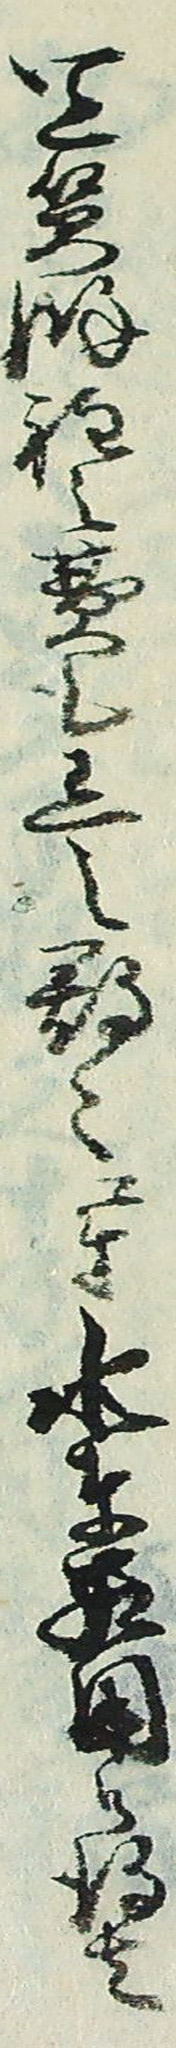運賃余程之費も有之郡々に付水車相用候得者
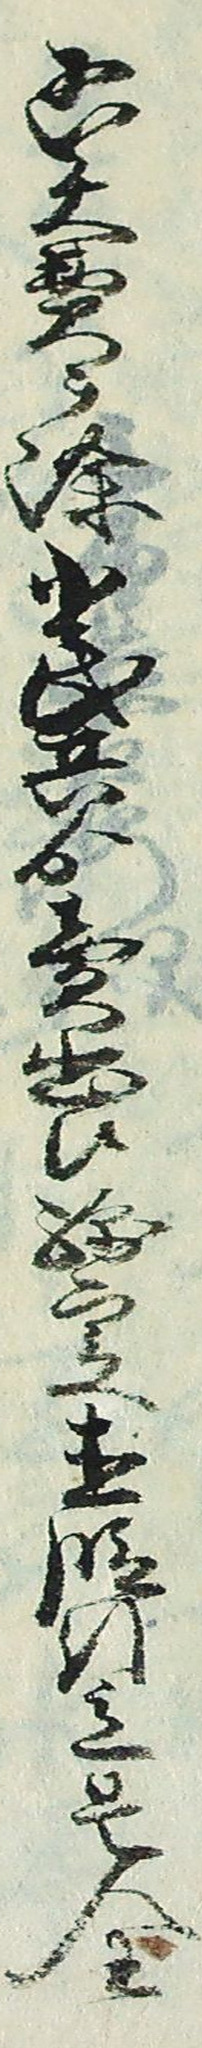右大費を除小民共ゟ売出候綿実直段引立是全
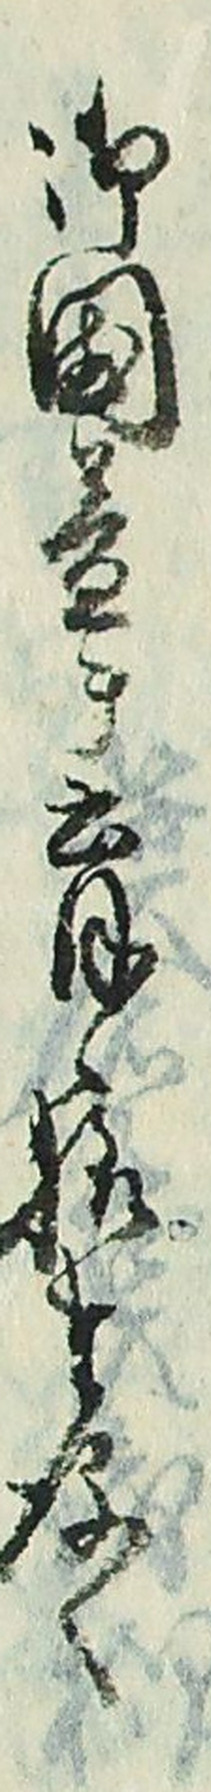御国益を育候様奉存候
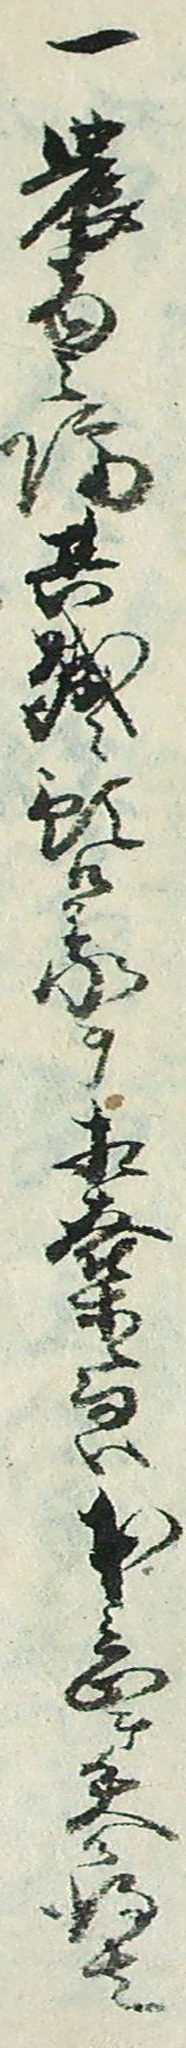一農商之傍其職に預候義を相奪候而は本志を
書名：油稼御取究ニ附御箇條書テ以被仰渡南北同役申談御答書控
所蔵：鳴門教育大学 Naruto University of Education
